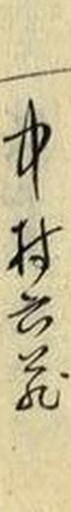中村六蔵
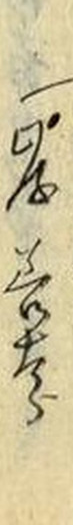岸善太郎
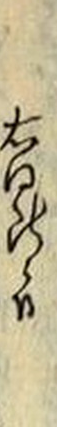右同断ニ付
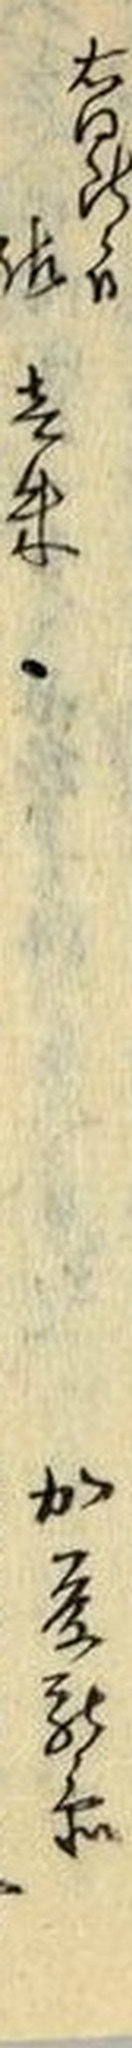銀壱朱加藤新兵衛
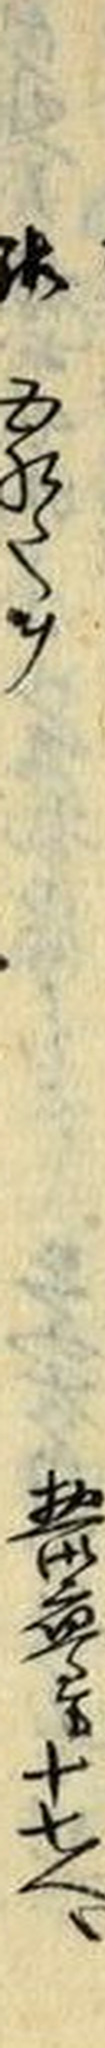銀五拾匁ヲ惣御鷹方十七人へ
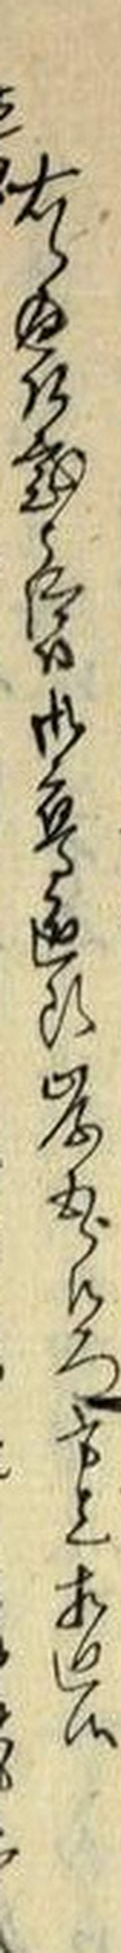右之通頂戴被仰付御鷹匠頭岸五郎左衛門方迄相廻候
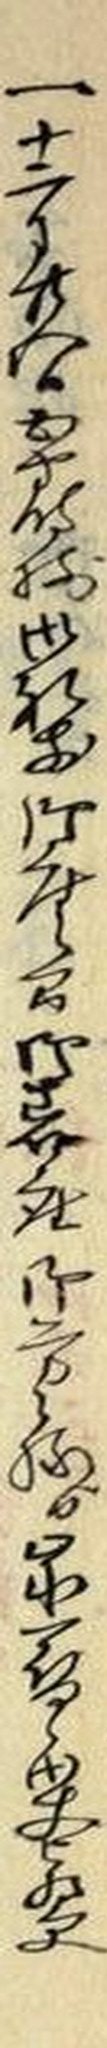一十二月廿八日五半時揃御礼前御座之間御着座御方々様ゟ歳暮之御使被為受
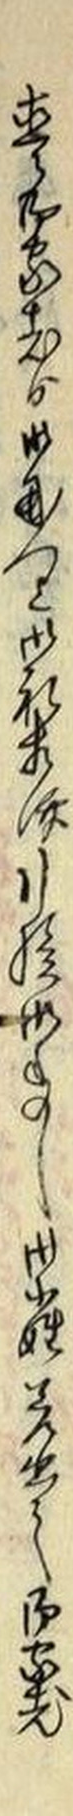直ニ御家老ゟ御用人迄御礼相済引続御手のし御小姓差出之御家老
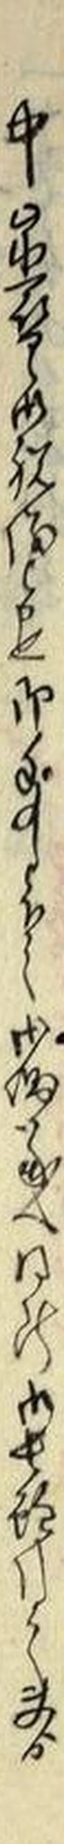中歳暮之御祝儀被申上御手のし被下之御側御用人同断御長蚫引之夫ゟ
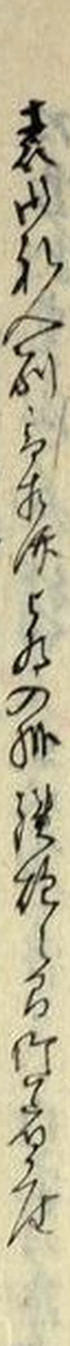表御礼人別ニ而相済被為入掛鉄砲之間御着座
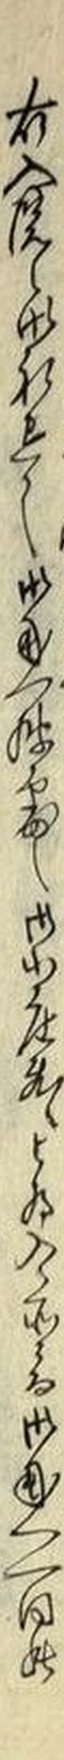右入院之御礼申上之御用人披露之御小座敷被為入候所ニ而御用人一同罷
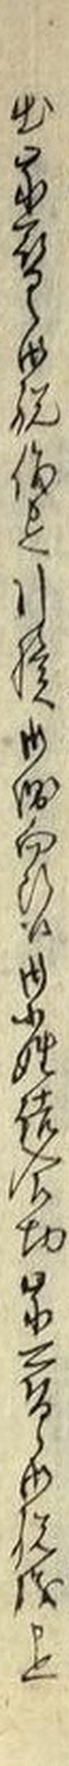出歳暮之御祝儀申上引続御側向頭取御小姓詰合切歳暮御祝儀申上
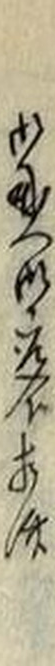御用人御取合相済
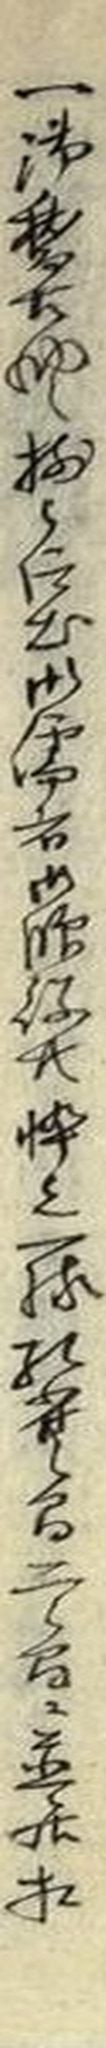一御稽古納之揃被仰出御儒者御師役共忰迄一統孔雀之間二之間ニ並居相
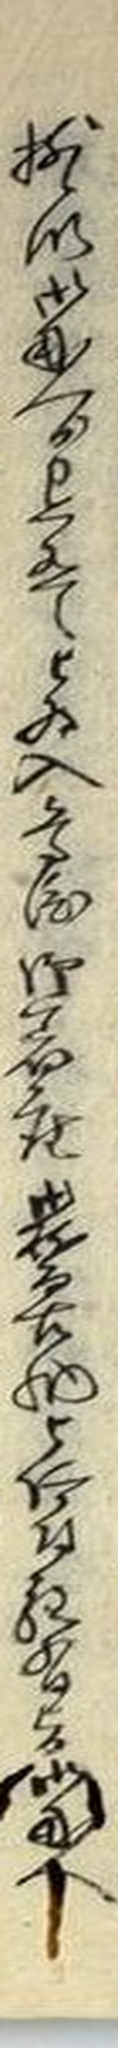揃候段御用人ゟ申上有之被為入鳥渡御着座御稽古納被仰付難有旨御用人
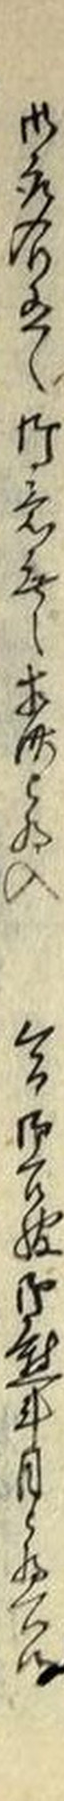御取合有之御意無之相済被為入今日御召服御熨斗目被為召候
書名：少傅日録抄（斉承付側向頭取日記、在国）
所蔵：福井県文書館 Fukui Prefectural Archives
